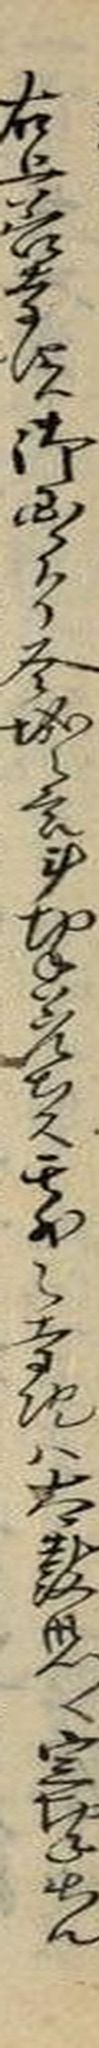右上善寺儀ハ御国へ下り登城候節切手差出ス其外之寺院ハ太鼓御門へ定切手出ル
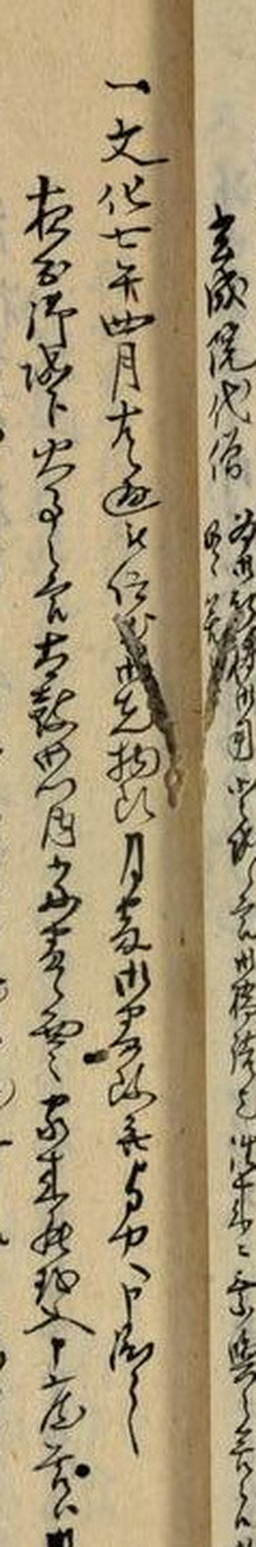一文化七午四月左之通被仰出候御先物頭月番御番改并与力へ申渡之
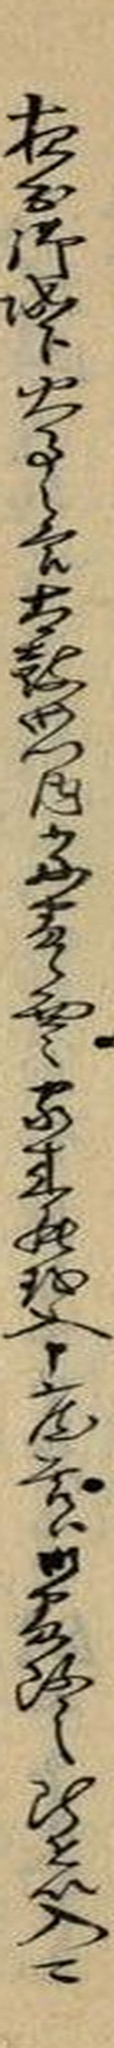夜分御城下火事之節太鼓御門内当番之面々家来罷越入申度節ハ御番改之断を以入可
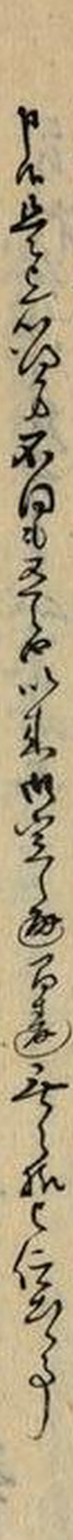申候是迄心得方不同も有之由以来御定之通間違無之様被仰出候事
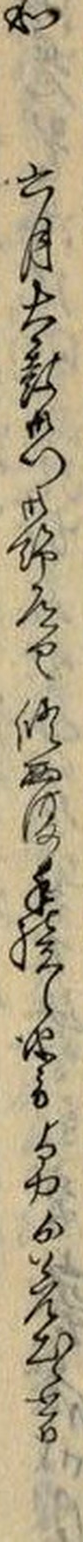一享和六月太鼓御門御飾道具修覆手続之儀ニ付与力ゟ差出候書付
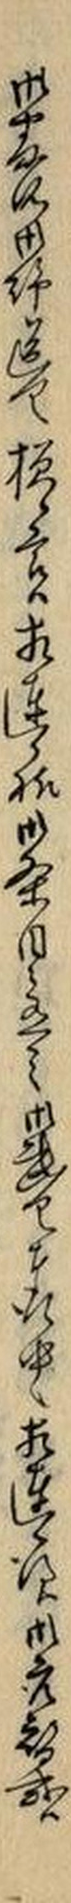御番所御飾道具損候節ハ相達候様御条目有之御武具奉行中へ相達候得ハ御取替或ハ
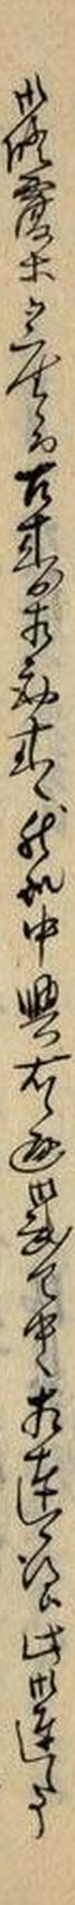御修覆等御座候而古来ゟ相勤来候然処中興右之通御武具中へ相達候得ハ此御達之事
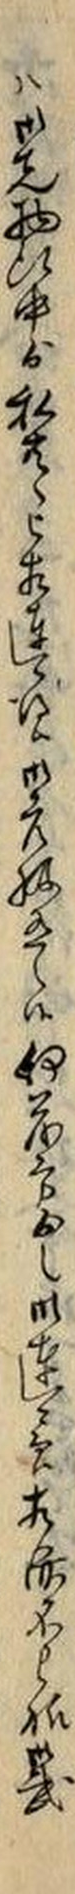ハ御先物頭中ゟ私共へ被相達候得ハ御取扱有之候何茂方ゟ之御達ニ而ハ相済不申候様御武
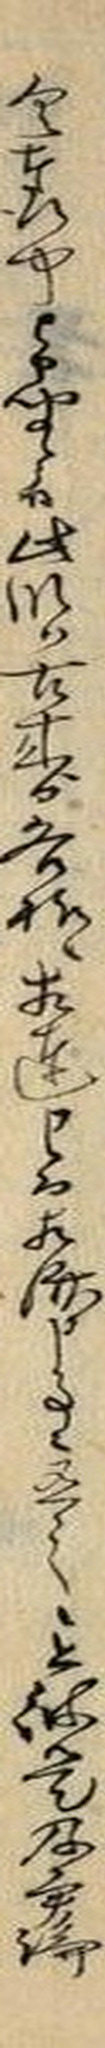具奉行中被申聞候ニ付此段古来ゟ各様へ相達申候而相済申事ニ有之候と彼是及争論
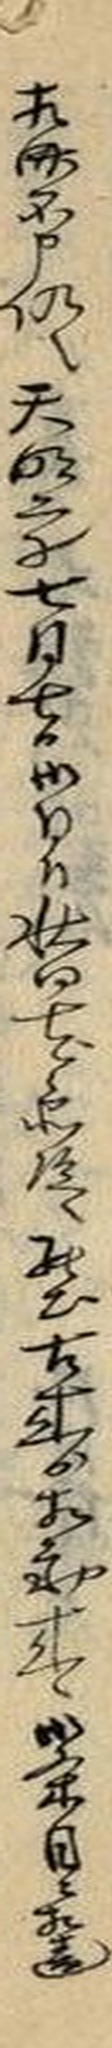相済不申仍之天明二寅七月七日御目付秋田七郎兵衛殿へ罷出古来ゟ相勤来候御条目ニ相違
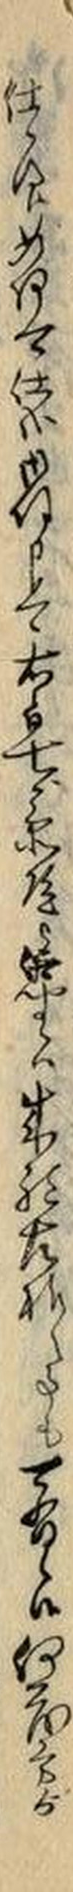仕候得ハ如何可仕候哉御伺申上候右ニ付七郎兵衛殿被仰聞候ハ成程左様之事も可有候何茂方ゟ
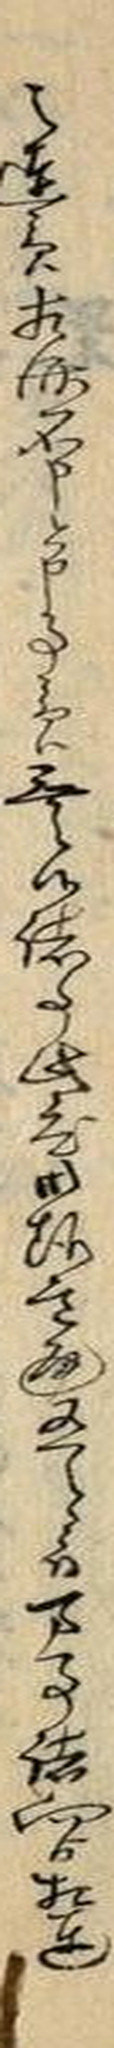之達ニ而ハ相済不申と申事ニ而ハ無之候諸事此度御趣意通有之候付万事諸向ゟ相達
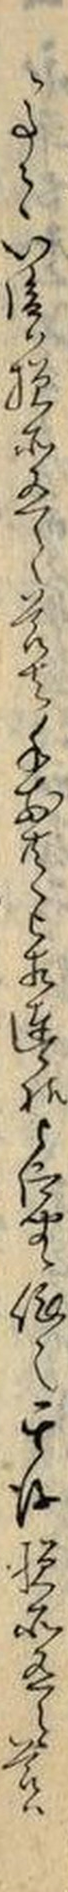候事ニ候以後損所有之候節は手前共へ被相達候様被仰聞候依之其後損所有之候節ハ
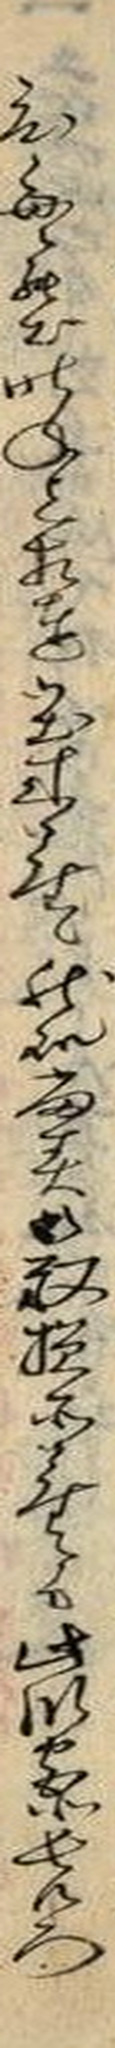度毎ニ罷出昨年迄相達御出来御座候然処当春御靫損所御座候ニ付此段宮北長左衛門
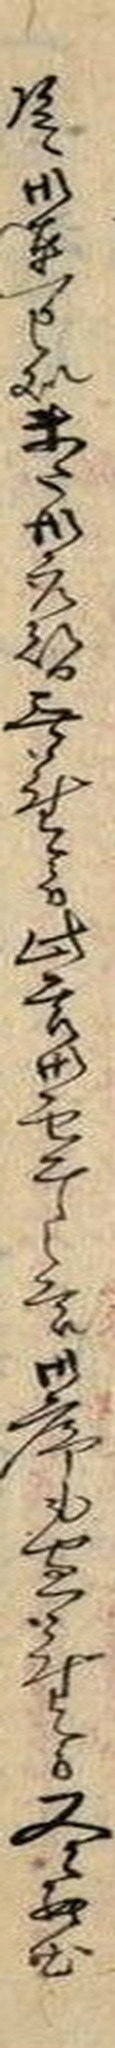殿へ御達申候処未た御取替無御座候ニ付此節御虫干之節御序も宜御座候付又々罷出
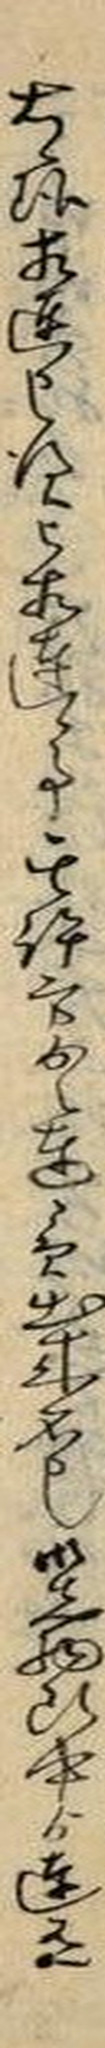右之趣相達申候得ハ被相達候事其許方ゟ之達ニ而ハ出来不申候御先物頭中ゟ達有
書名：御門御櫓之部
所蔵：福井県文書館 Fukui Prefectural Archives
